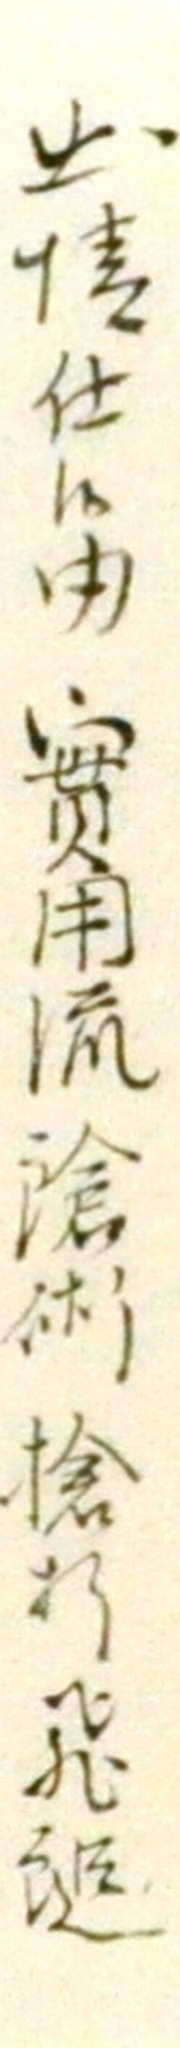出精仕候由実用流鎗術搶打飛鎚
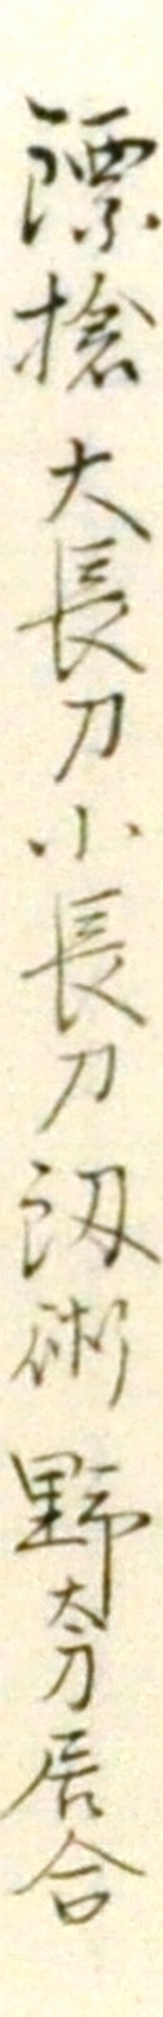鏢搶大長刀小長刀鎗術野太刀居合
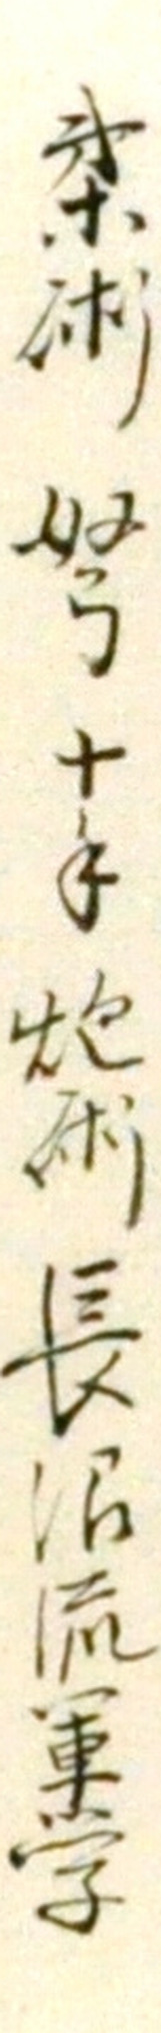柔術奴弓十手炮術長沼流軍学
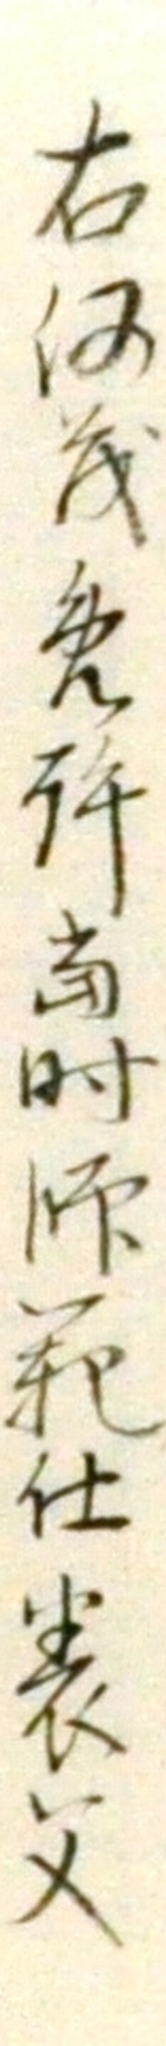右何も免許当時師範仕養父
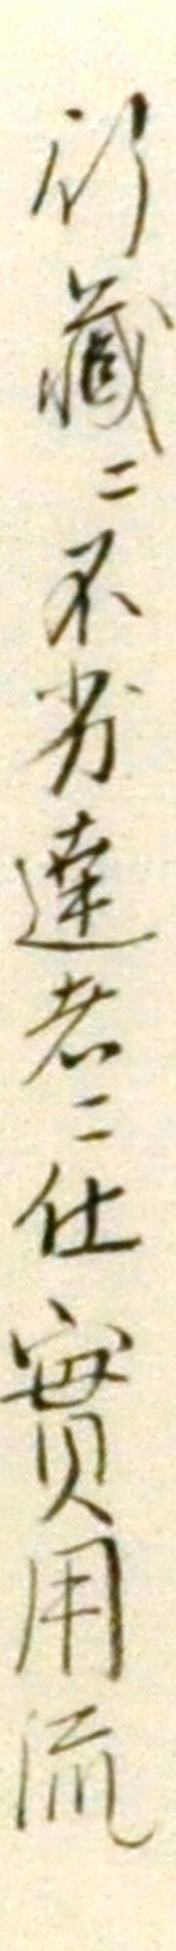行蔵ニ不劣達者ニ仕実用流
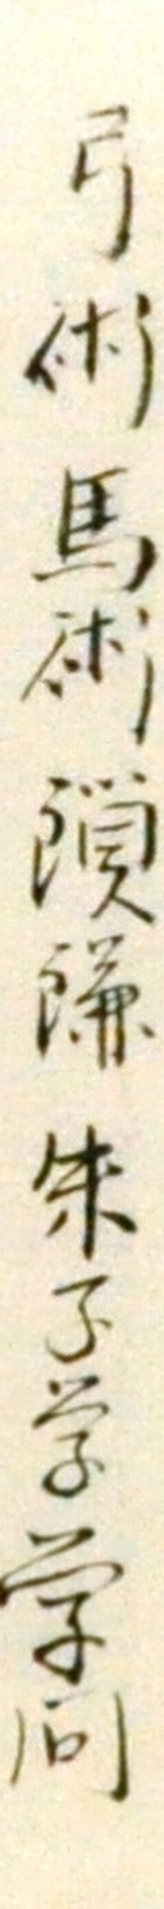弓術馬術鎖鎌朱子学学問
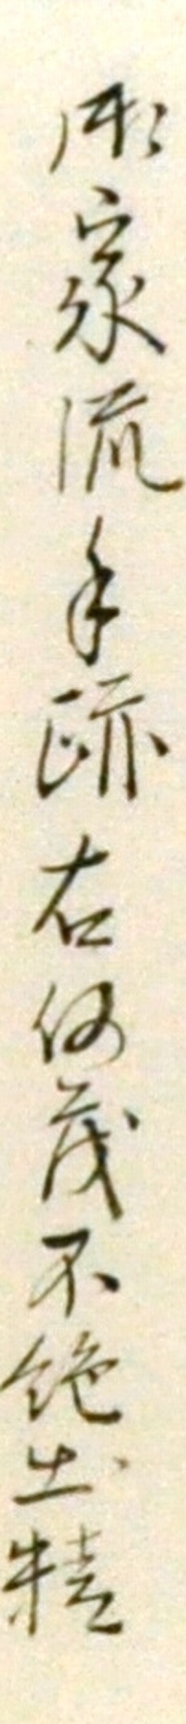御家流手跡右何も不絶出精
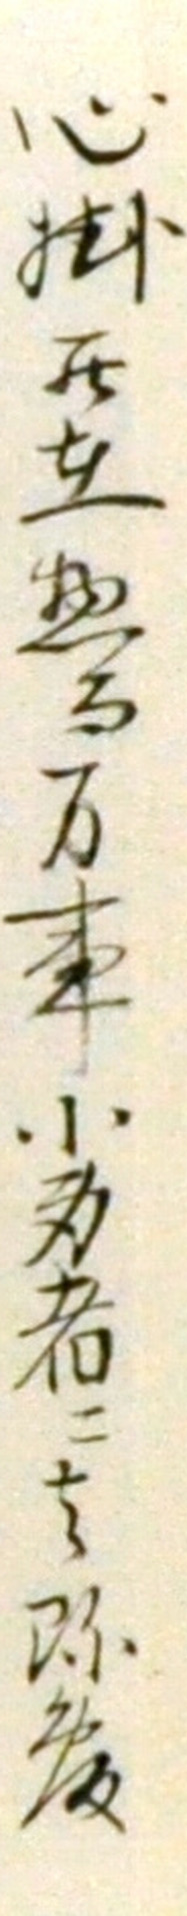心掛罷在惣而万事小身者ニは珍敷
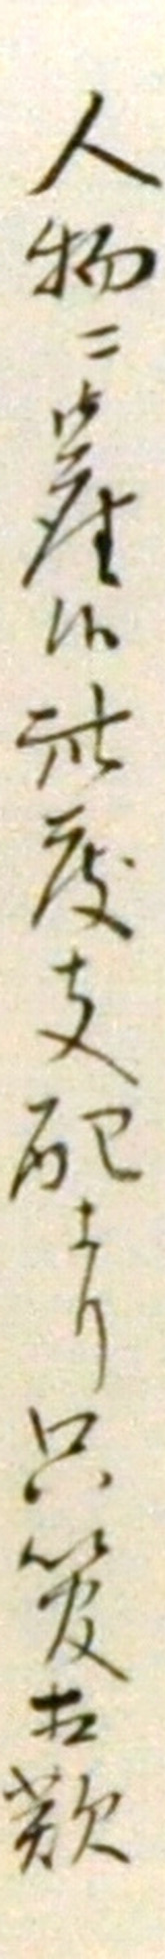人物ニ御座候此度支配より只管相歎
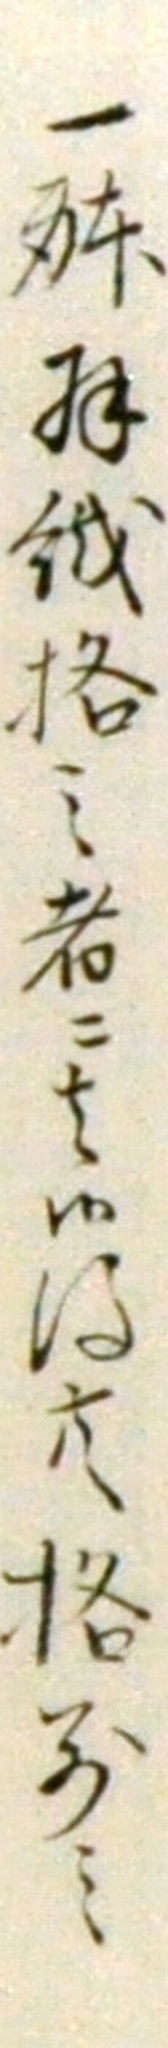一躰羽織格之者ニは候得共格別之
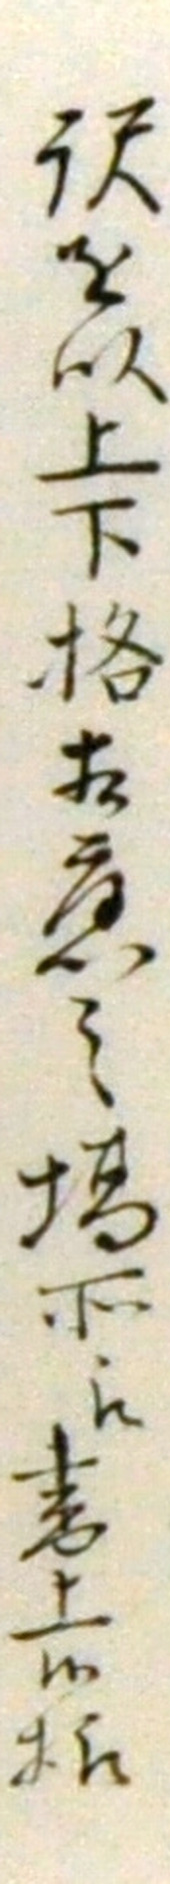訳を以上下格相応之場所江書上候様

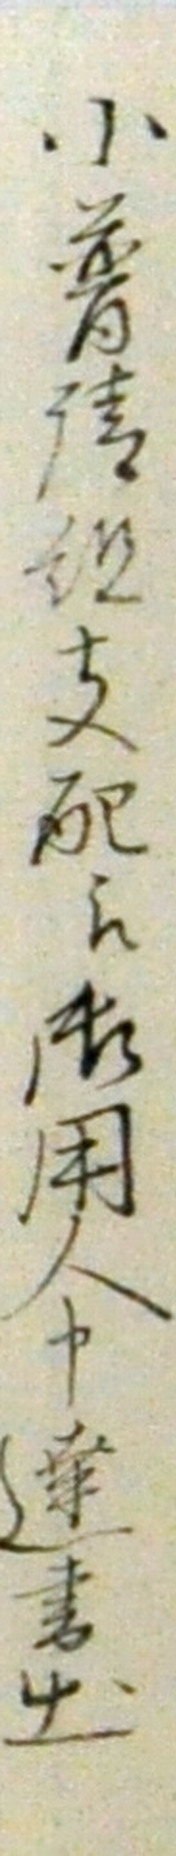小普請組支配江御用人申達書出
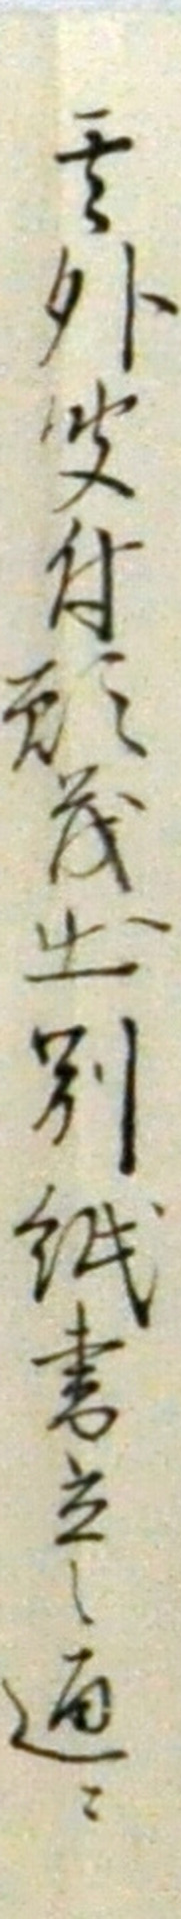其外聞付願も出別紙書立之通ニ
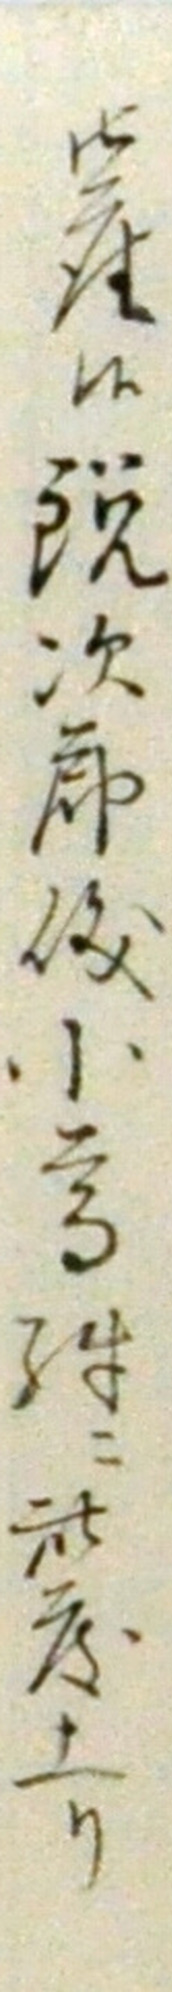御座候鋭次郎儀小高殊ニ此度上り
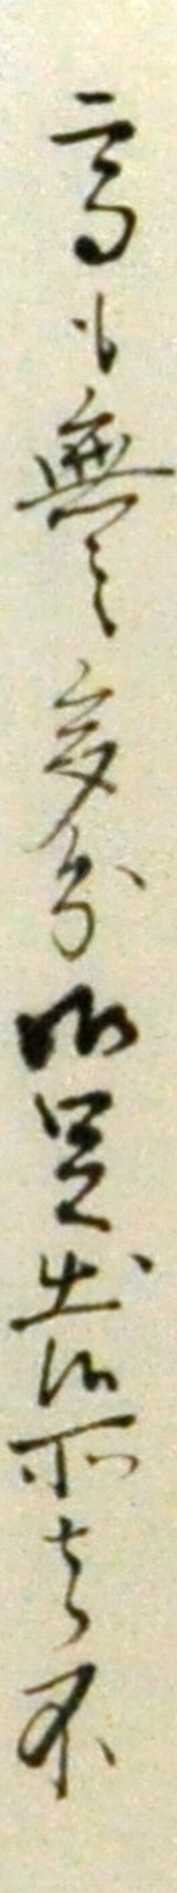高も無之多分御足出候所者不
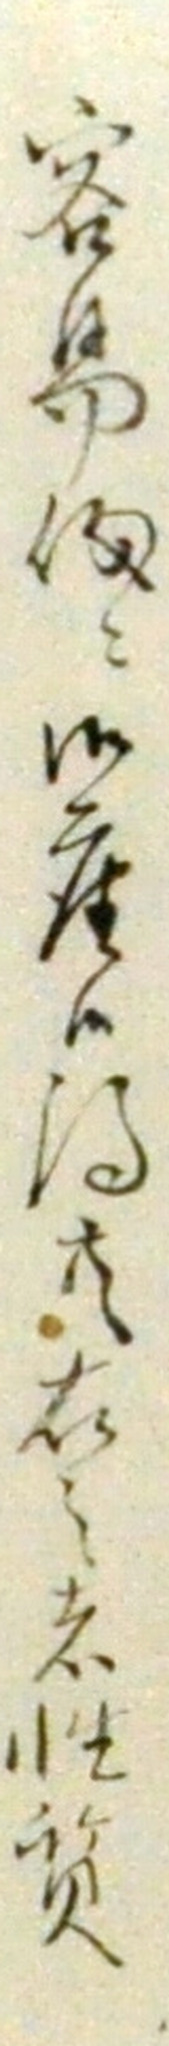容易儀ニ御座候得共右之者性質
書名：下案・西丸火之番調
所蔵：伊那市立高遠町図書館・合同会社AMANE
